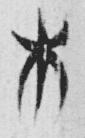木
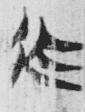於
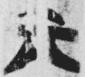亓（其）
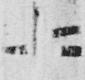上
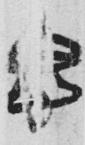思
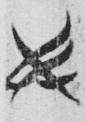民
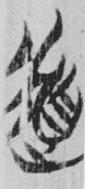道
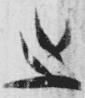之
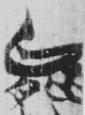能
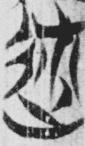述（遂）
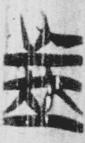者
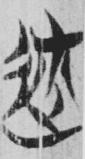述（遂）
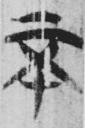不
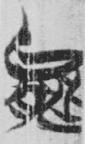能
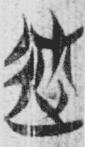述（遂）
